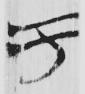于
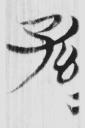孫=
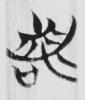若
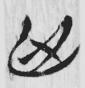臣
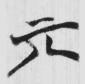亓
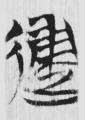{辶帚}
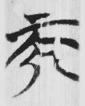而
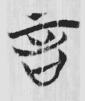言
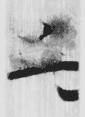之
